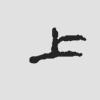上
